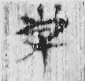東
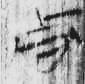周
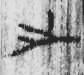之
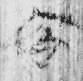客
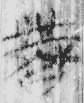○（許）
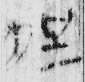○（盈）
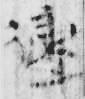歸
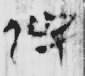{尸拃}（胙）
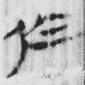於
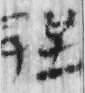郢
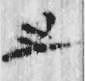之
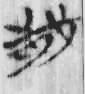歲（歲）
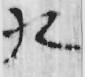九
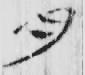月
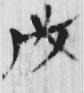戊
